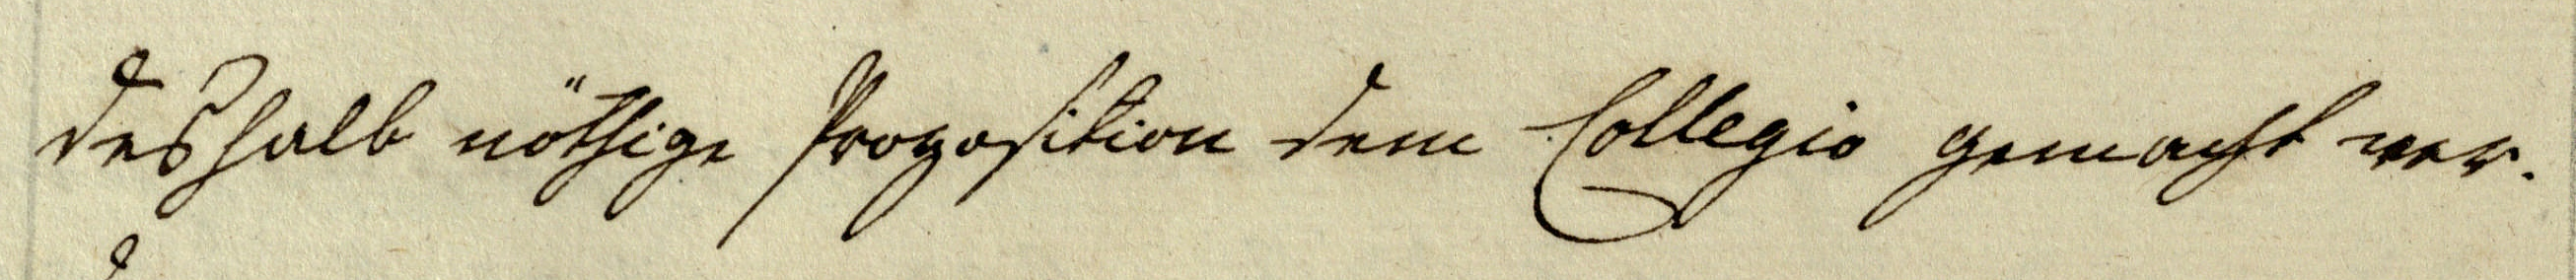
deshalb nöthige Proposition dem Collegio gemacht wer¬
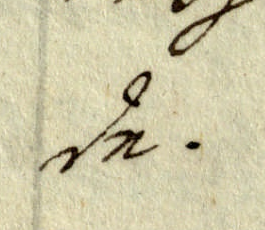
de.
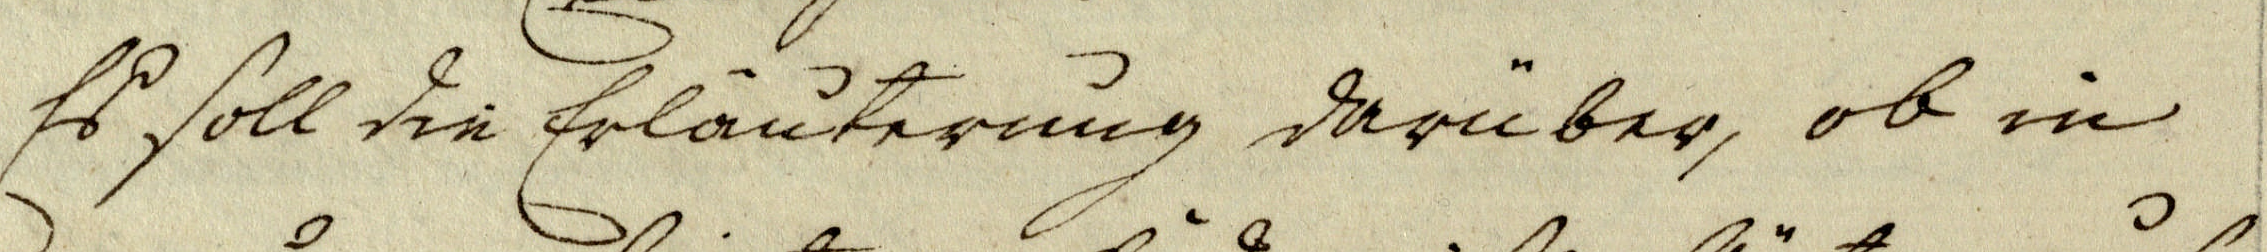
Es soll die Erläuterung darüber, ob in
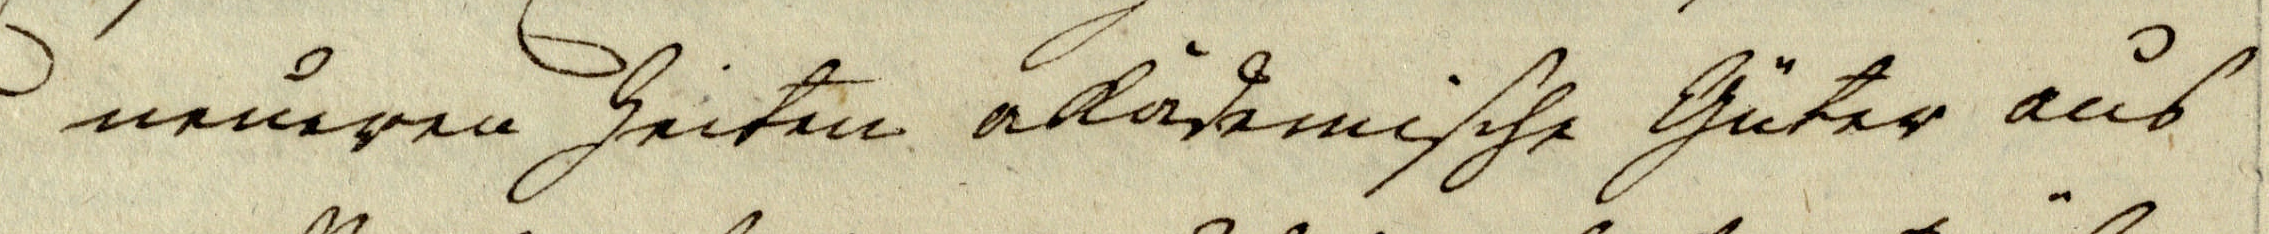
neueren Zeiten akademische Güter aus
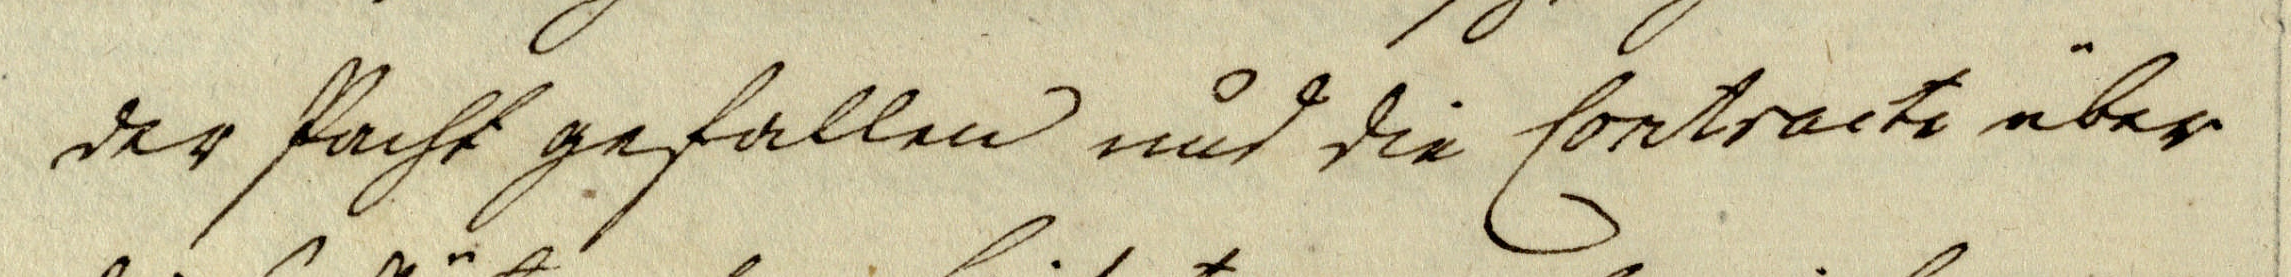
der Pacht gefallen und die Contracte über
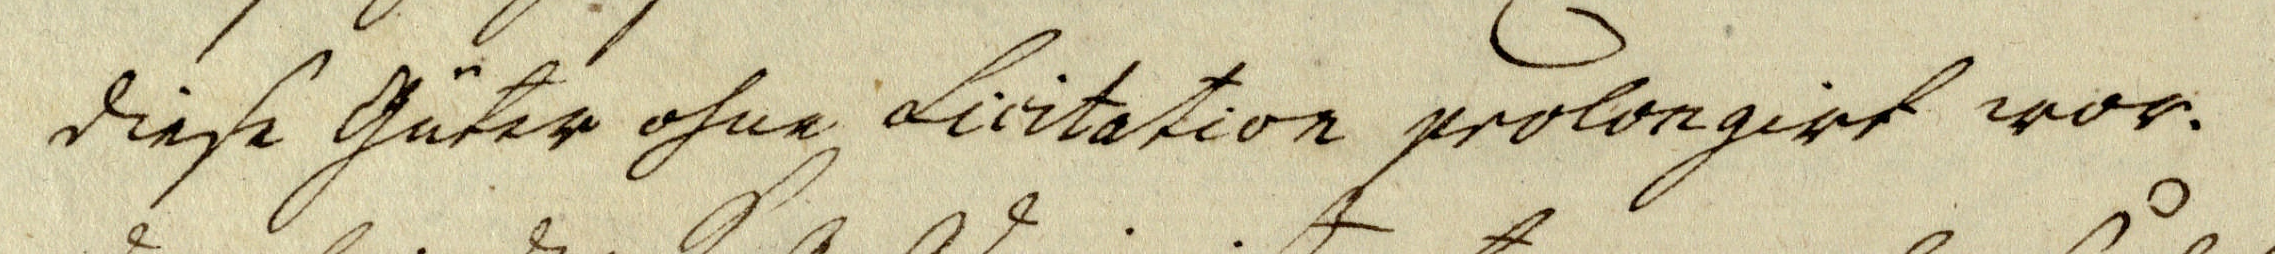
diese Güter ohne Licitation prolongirt wor¬
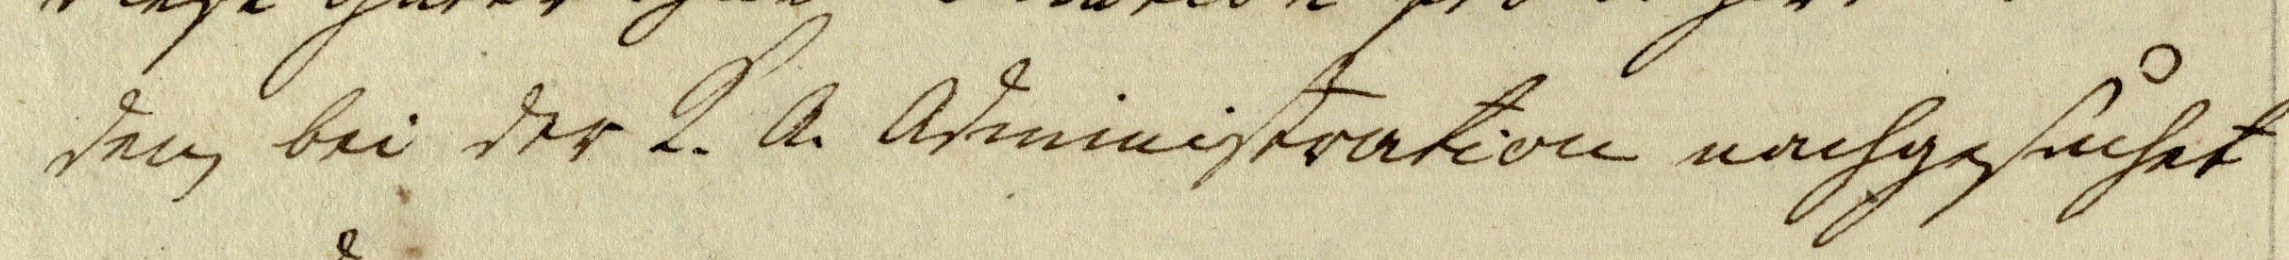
den, bei der K. A. Administration nachgesuchet
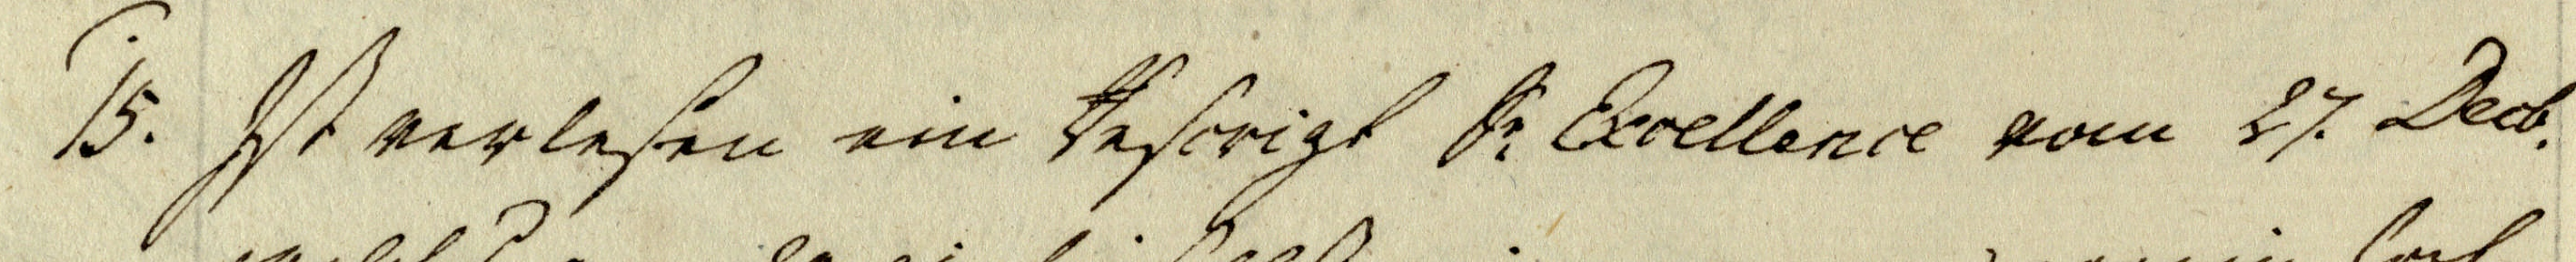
15. Ist verlesen ein Rescript Sr Excellence vom 27. Decb.
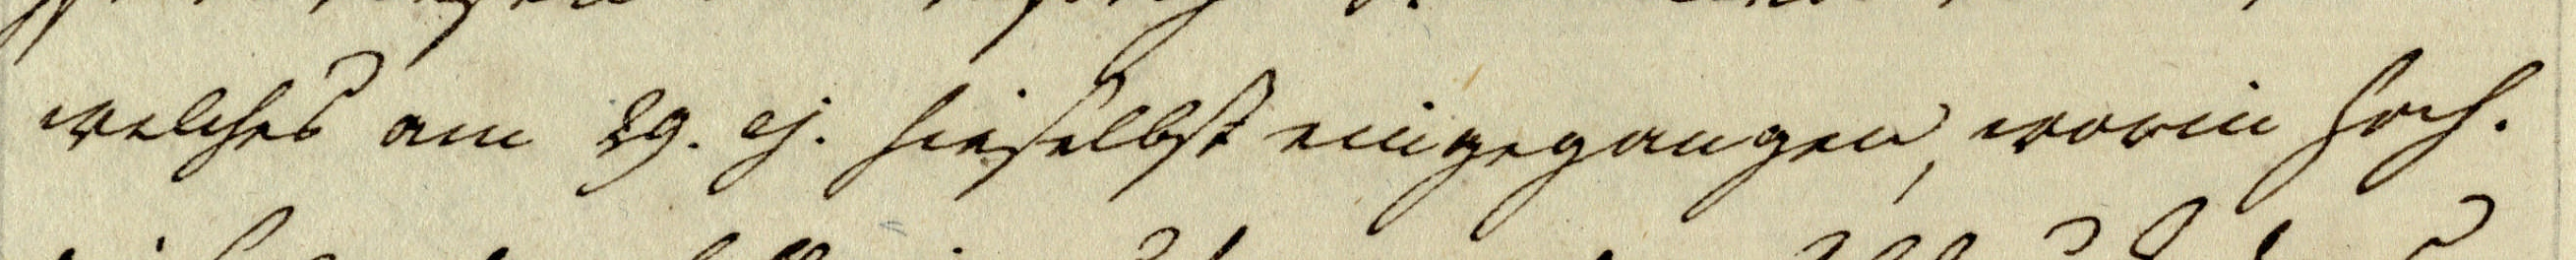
welches am 29. ej. hieselbst eingegangen, worin hoch¬
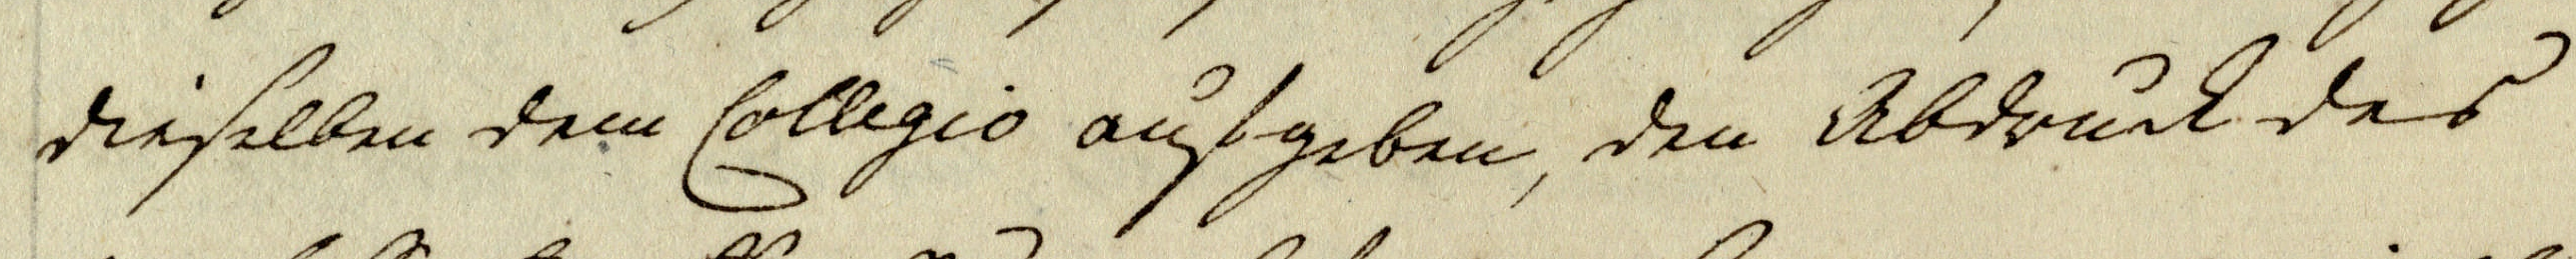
dieselben dem Collegio aufgeben, den Abdruck des
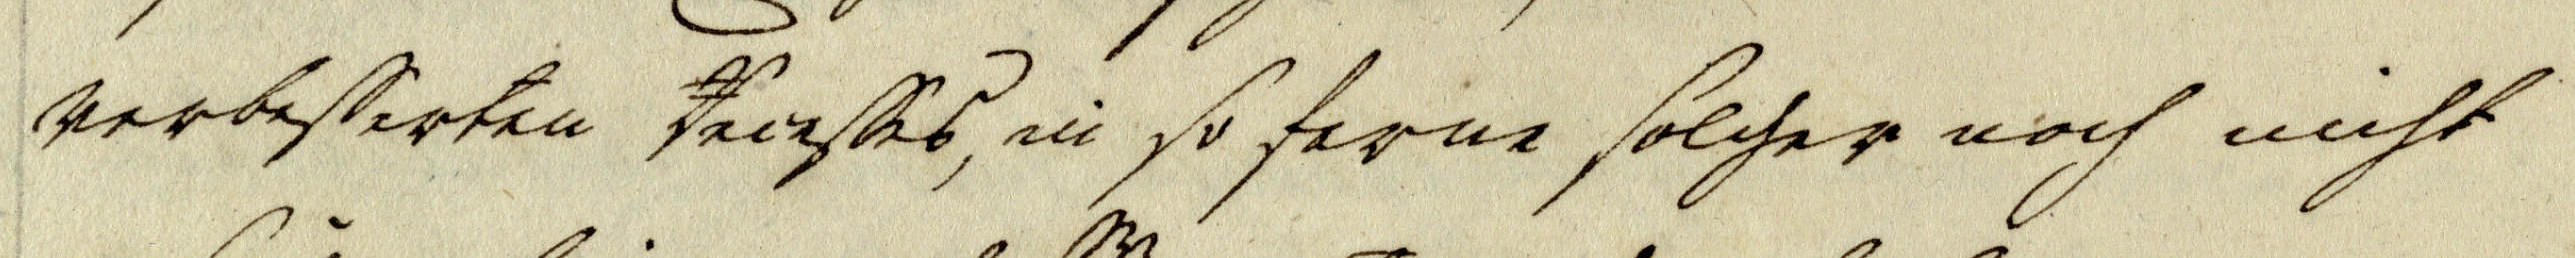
verbesserten Recesses, in so ferne solcher noch nicht
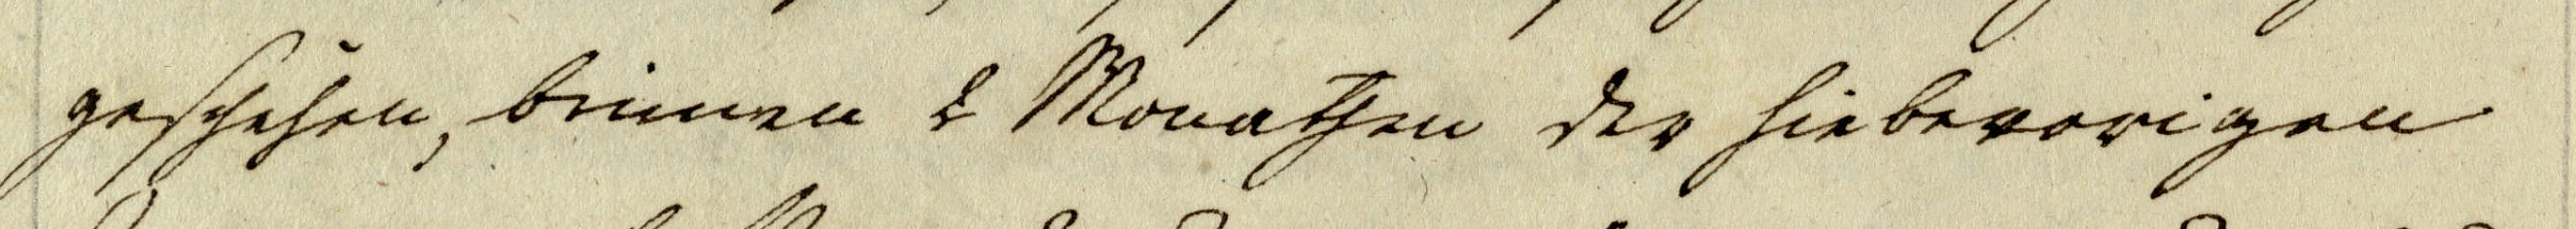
geschehen, binnen 2 Monathen der hiebevorigen
